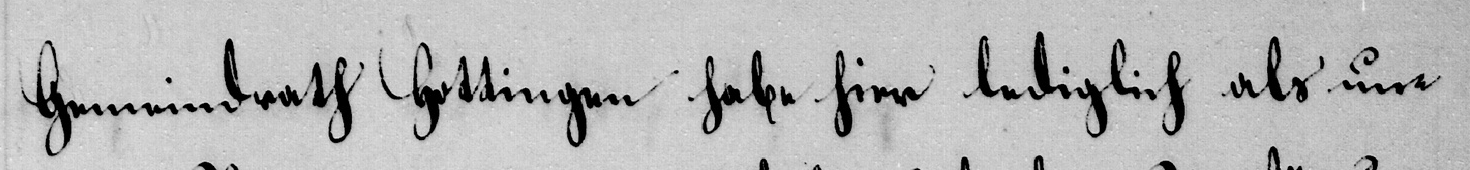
Gemeindrath Hottingen habe hier lediglich als un¬
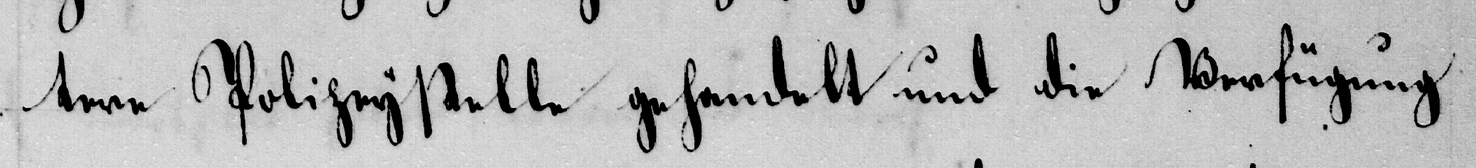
tere Polizeystelle gehandelt und die Verfügung
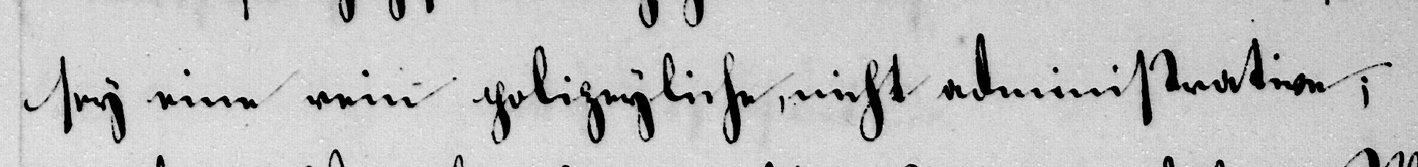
sey eine rein polizeyliche, nicht administrative;
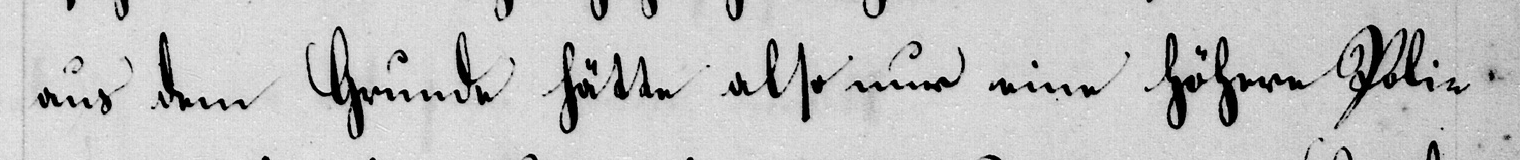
aus dem Grunde hätte also nur eine höhere Poli¬
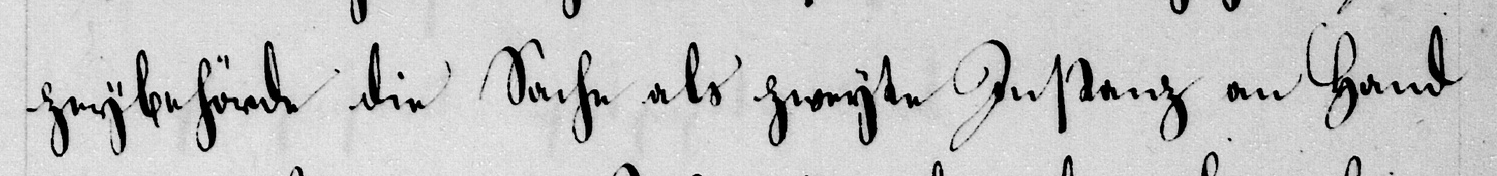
zeybehörde die Sache als zweyte Instanz an Hand
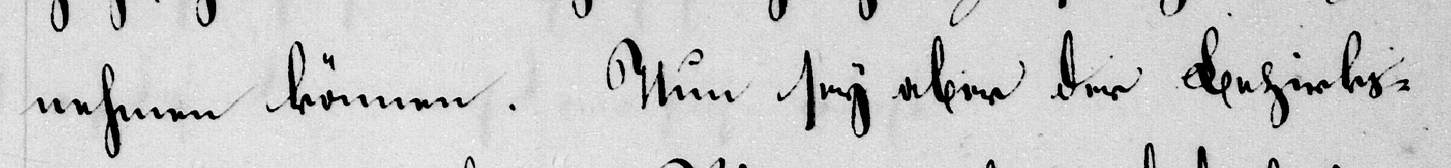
nehmen können. Nun sey aber der Bezirks¬
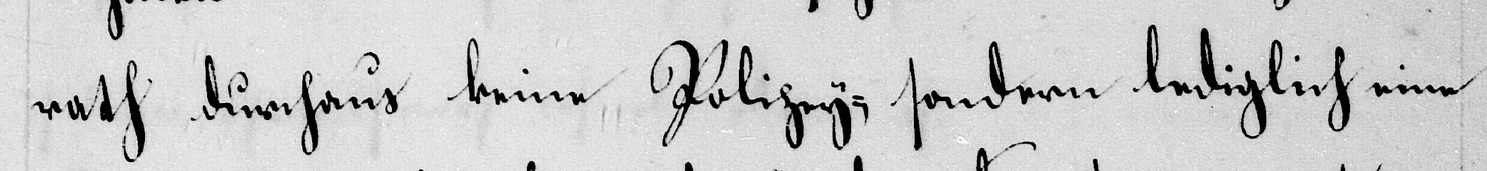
rath durchaus keine Polizey-, sondern lediglich eine
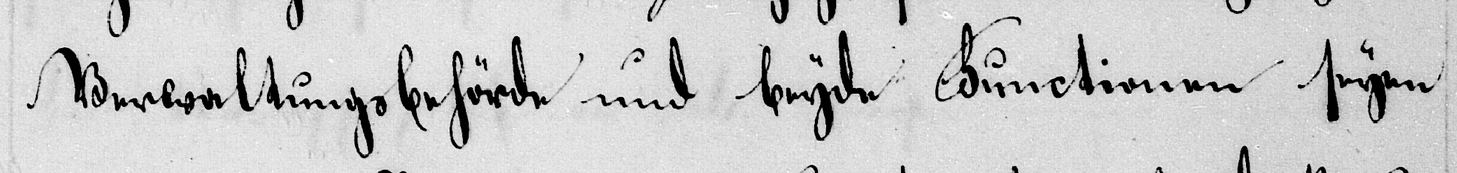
Verwaltungsbehörde und beyde Functionen seyen
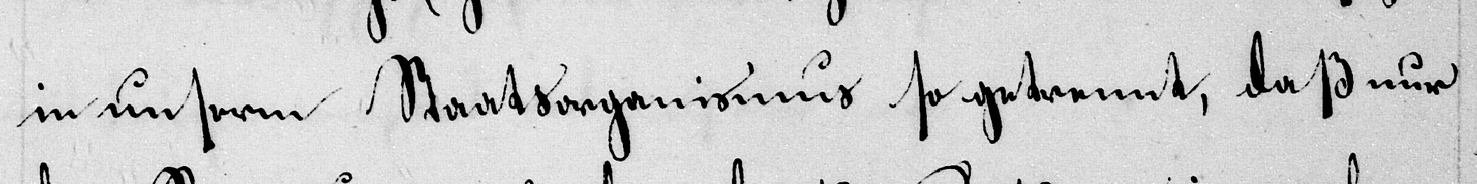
in unserm Staatsorganismus so getrennt, daß nur
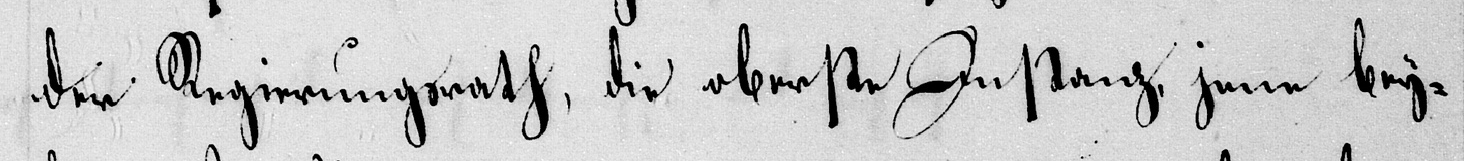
der Regierungsrath, die oberste Instanz, jene bey¬
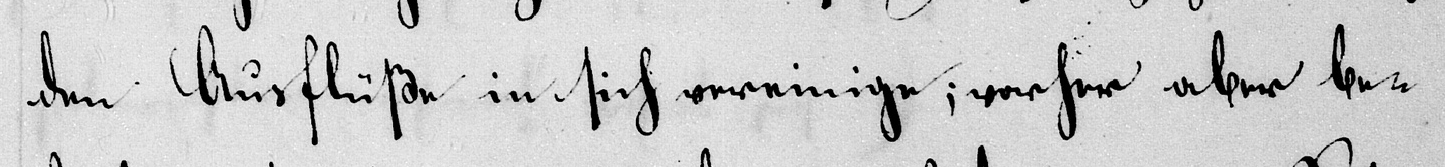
den Ausflüße in sich vereinige; vorher aber be¬
